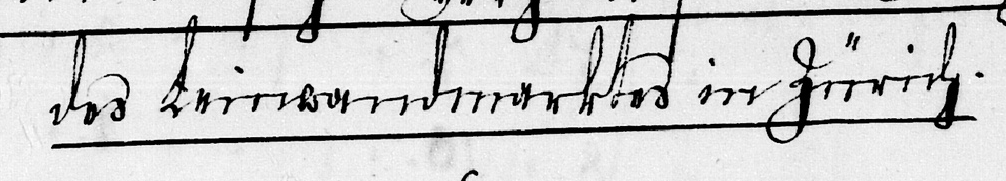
des Leinwandmarktes in Zürich.
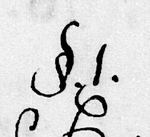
Be¬
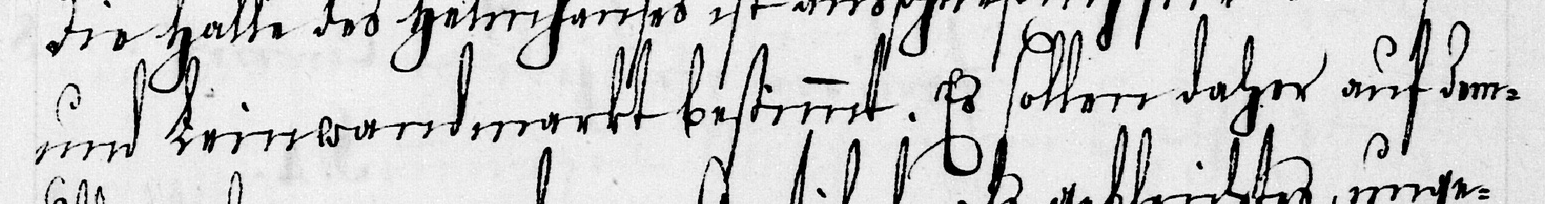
und Leinwandmarkt bestimmt. Es sollen daher auf dem¬
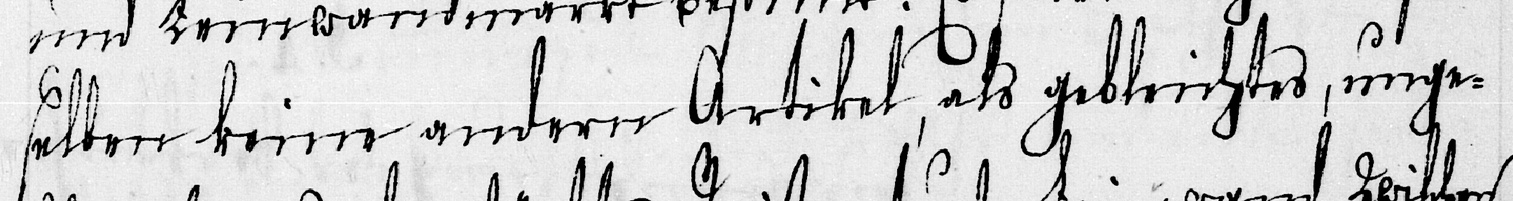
selben keine andern Artikel, als gebleichtes, unge¬
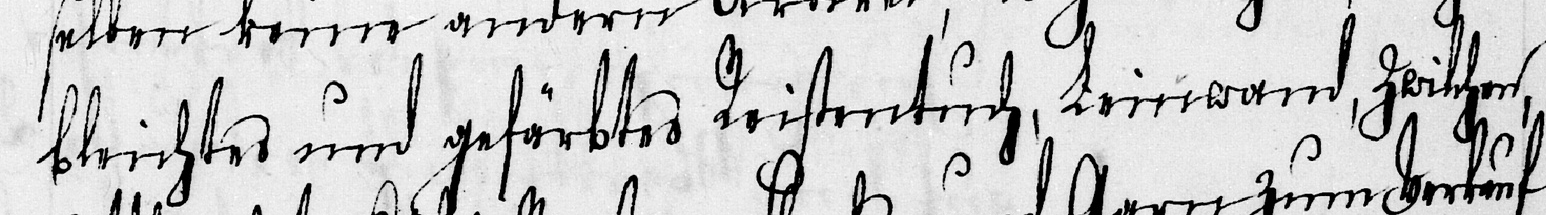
bleichtes und gefärbtes Reistentuch, Leinwand, Zwilchen,
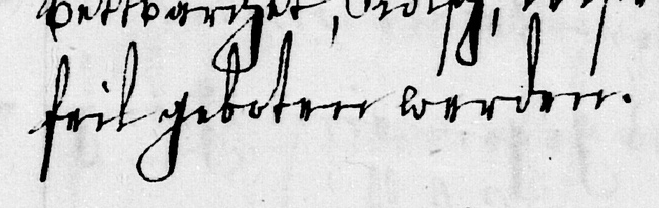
feil geboten werden.
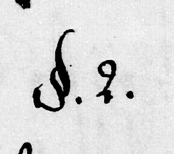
§. 2.
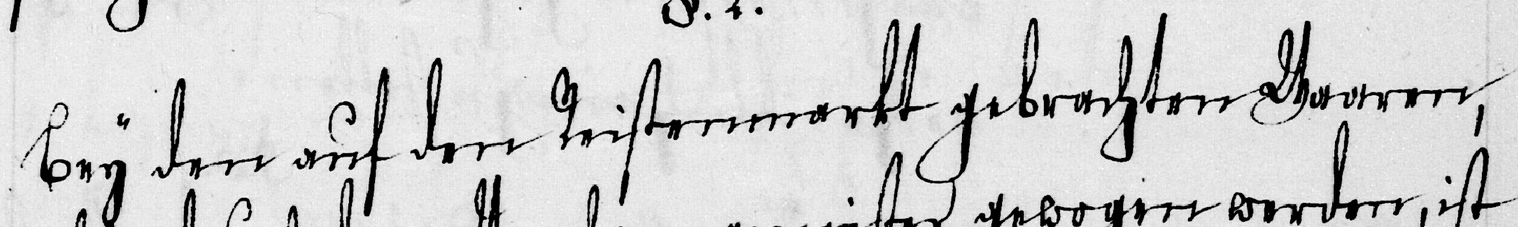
Bey den auf den Reistenmarkt gebrachten Waaren,
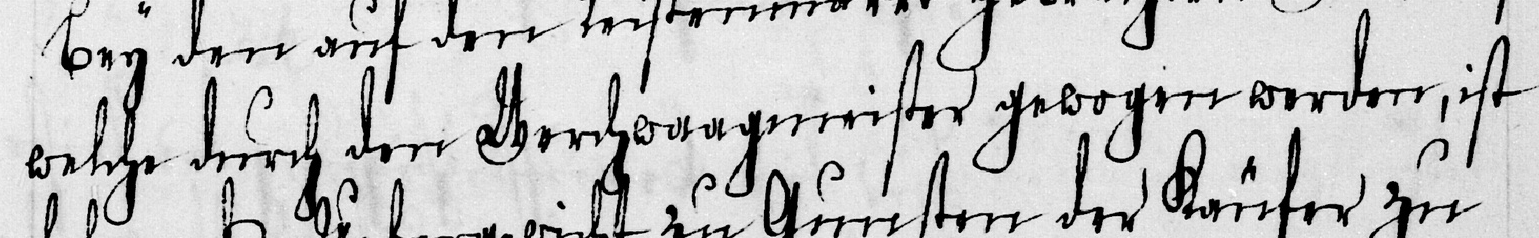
welche durch den Werchwaagmeister gewogen werden, ist
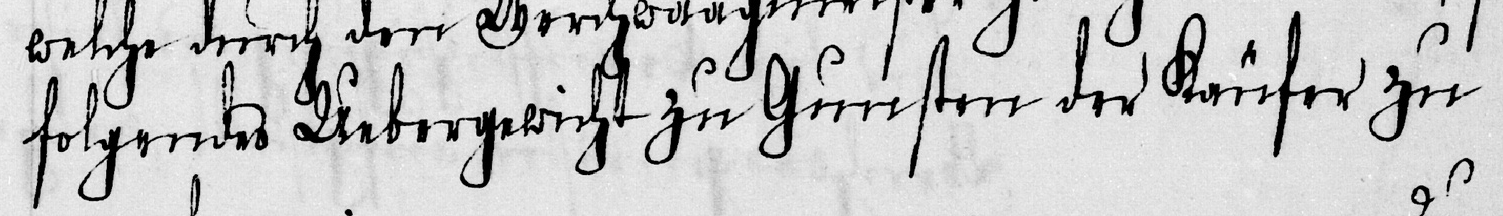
folgendes Uebergewicht zu Gunsten der Käufer zu
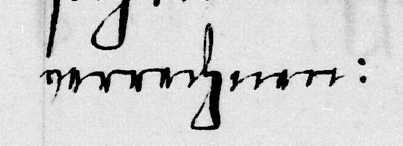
verrechnen:
